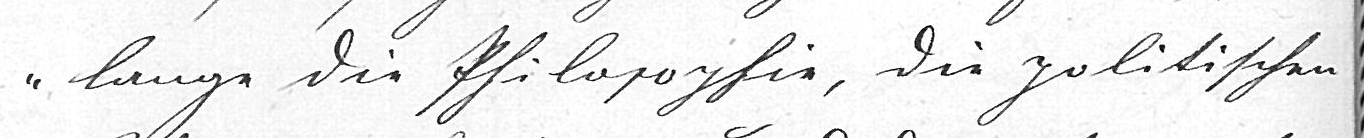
" lange die Philosophie, die politischen
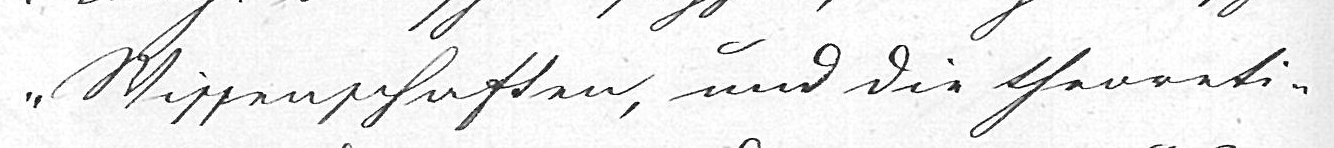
" Wissenschaften, und die theoreti-
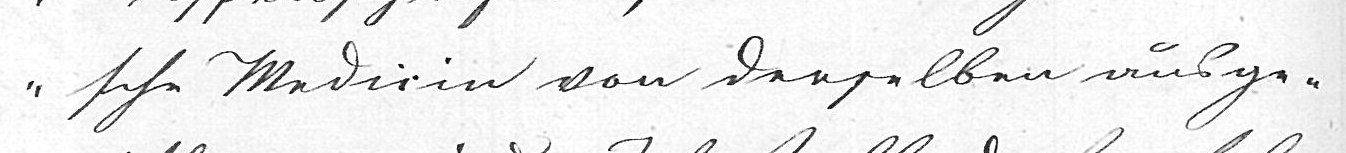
" sche Medicin von derselben ausge-
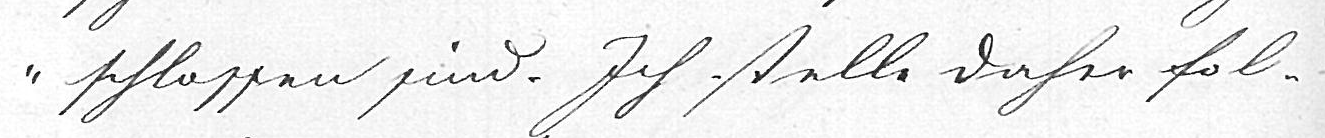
" schlossen sind. Ich stelle daher fol-
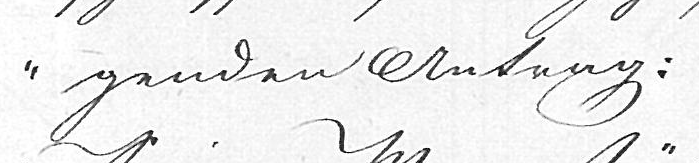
" genden Antrag:
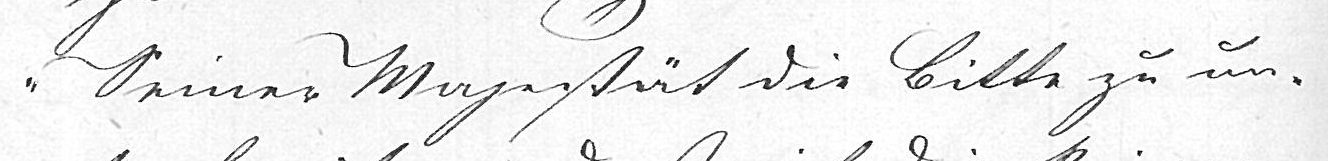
" Seiner Majestät die Bitte zu un-
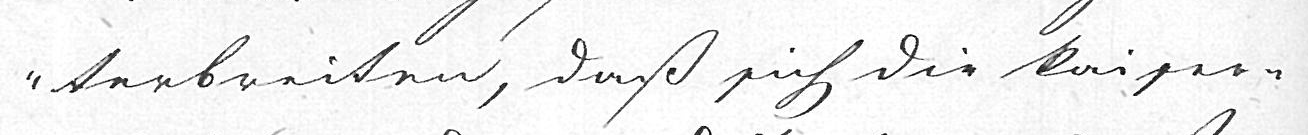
" terbreiten, daß sich die kaiser-
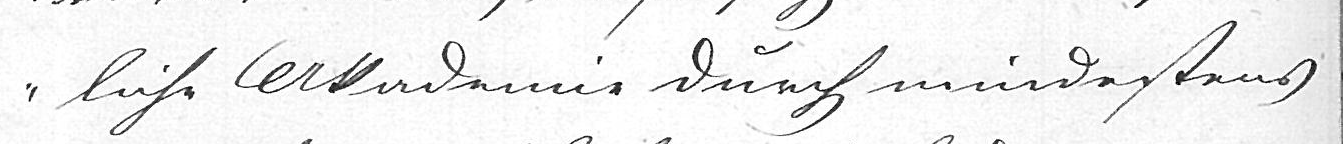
" liche Akademie durch mindestens
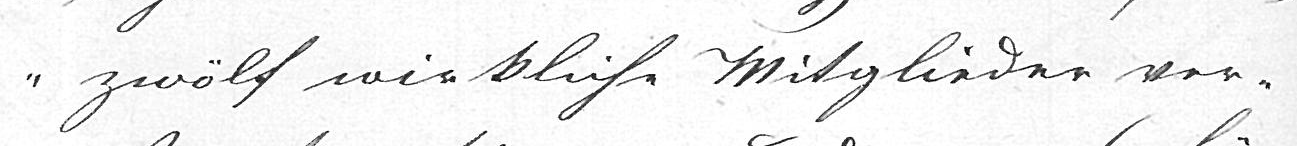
" zwölf wirklichen Mitglieder ver-
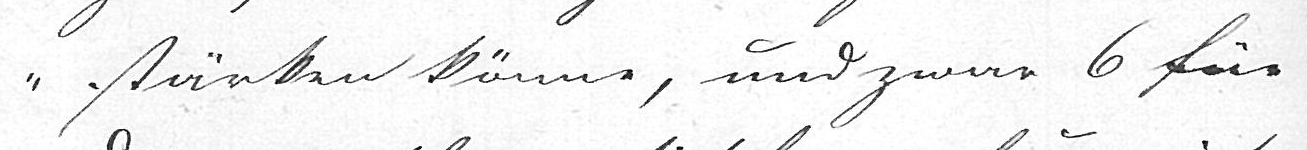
" stärken könne, und zwar 6 für
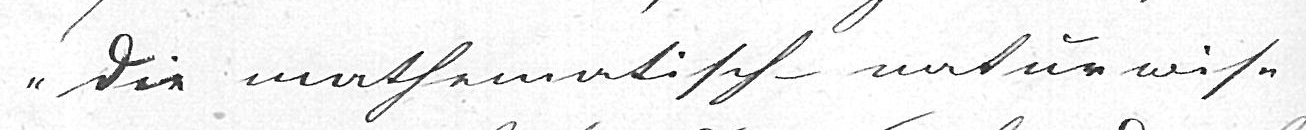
" die mathematisch-naturwis-
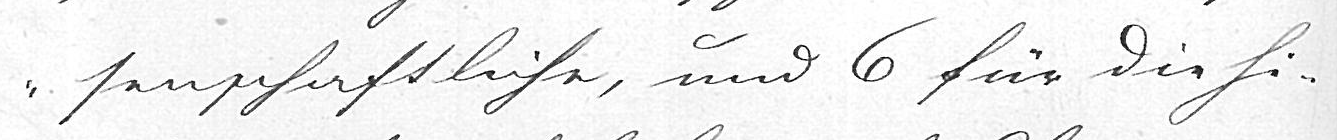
" senschaftliche, und 6 für die hi-
